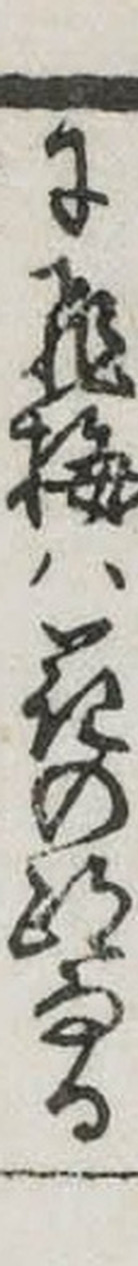に飛梅は花の跡なる
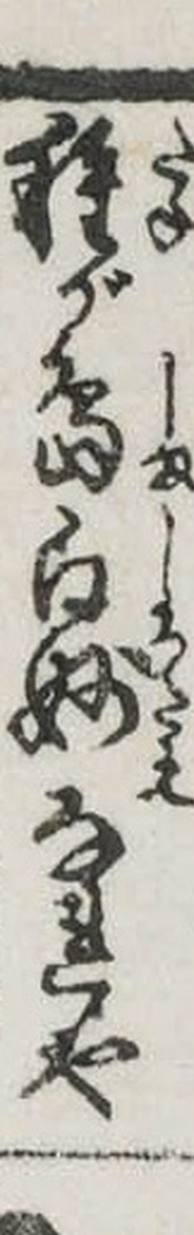種が島白妙なれや
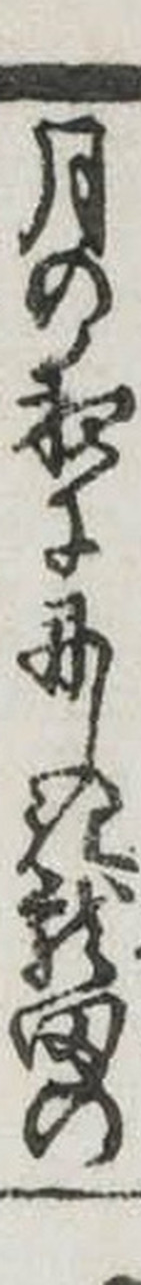月の夜ににしき龍田の
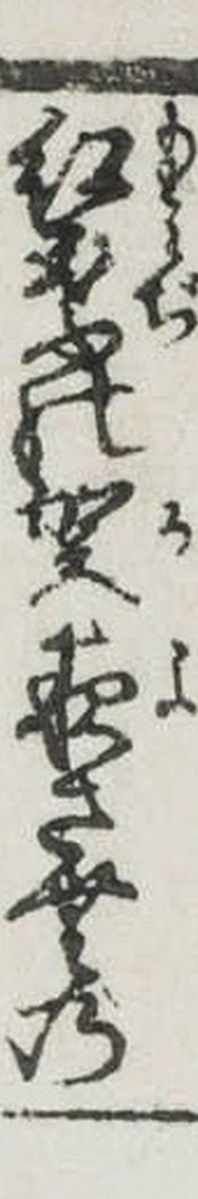紅葉の賀夜さむの
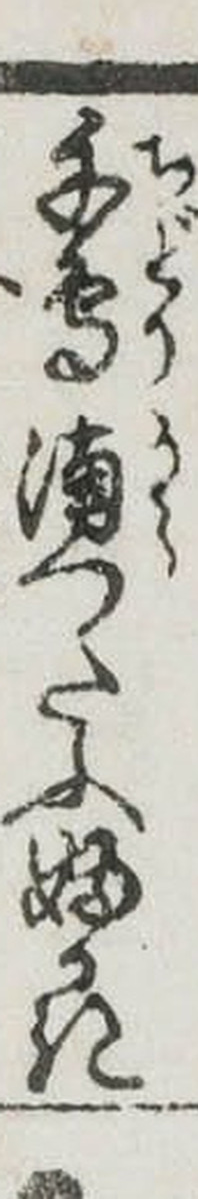千鳥浦つたふふかき
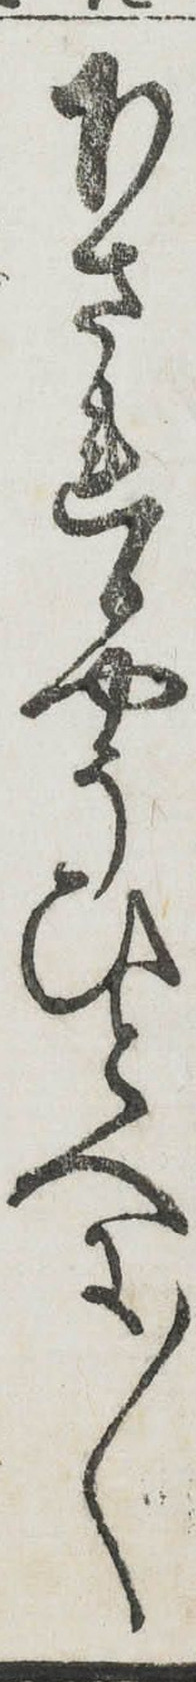下され候やうひとへに〳〵
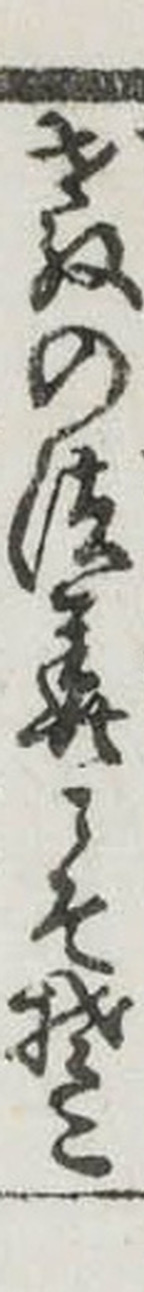教の法花こそそこ
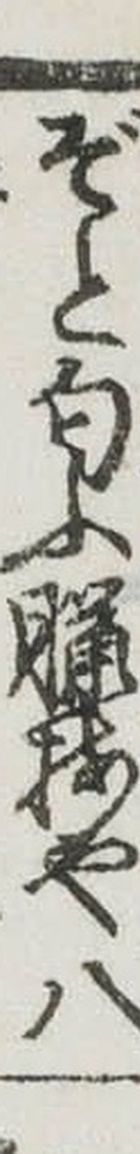ぞと匂ふ臘梅や八
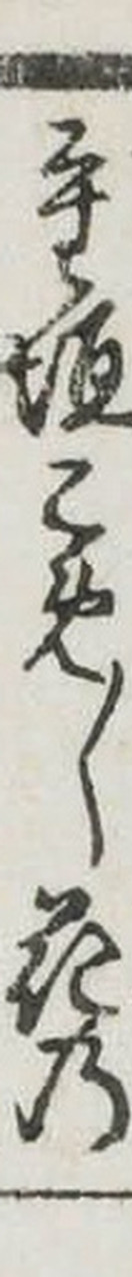重垣こめし花の
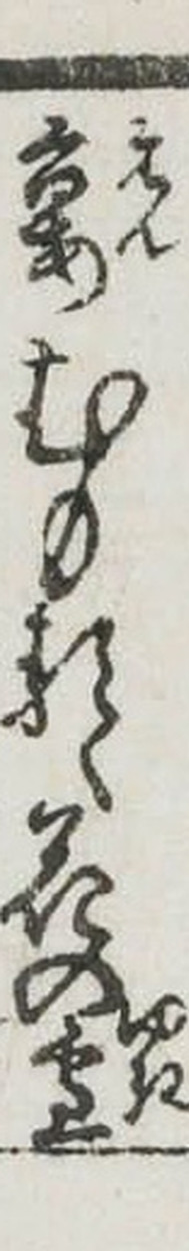宴むもるる花の雪
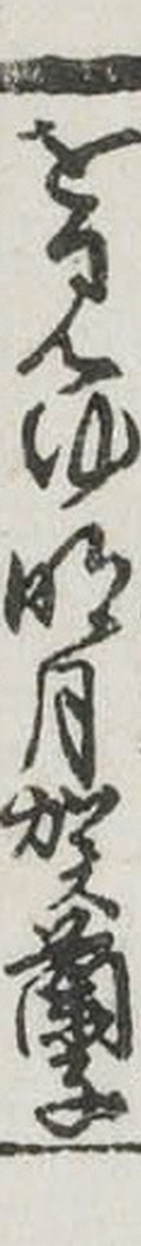を見ゆ名月賀蘭子
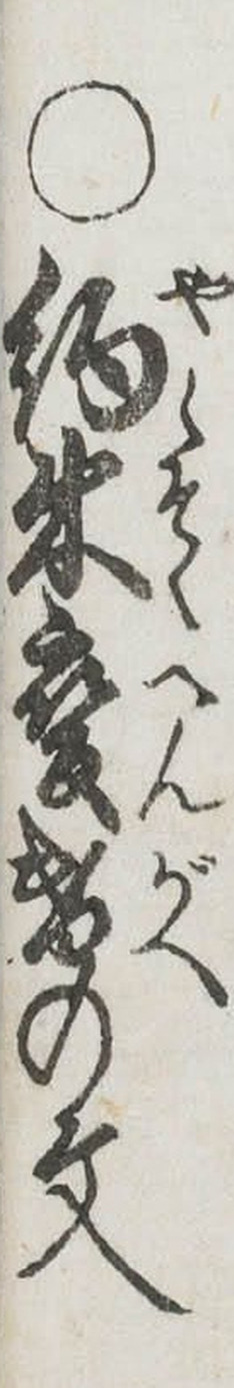○約束変替の文
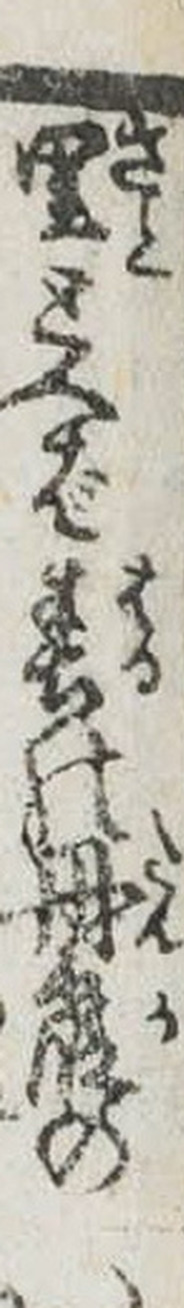里とへば春の丹霞の
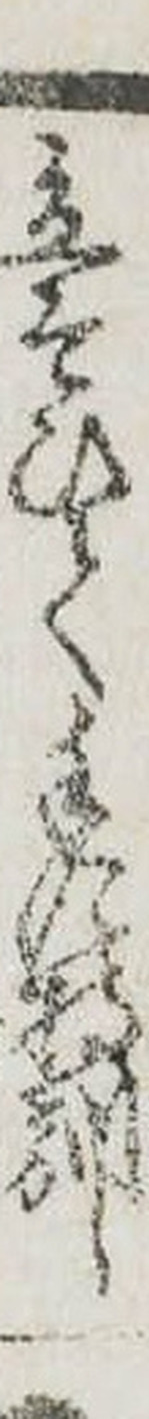立そひて手に持馴し
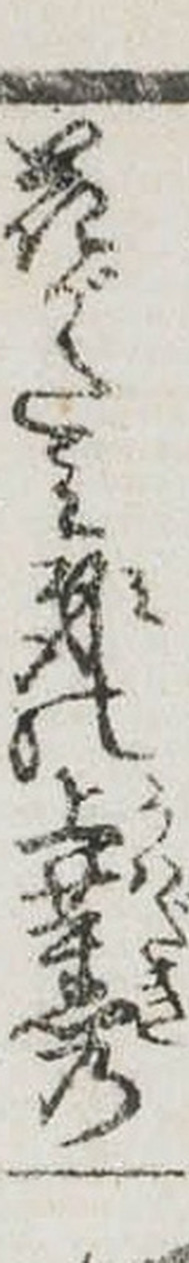花がたみ身の上薫の
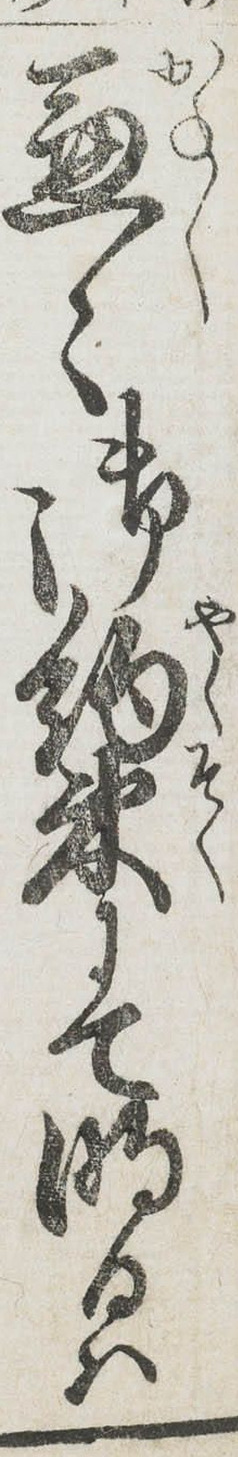兼々御約束にて明日は
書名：頭書萬用婦人手紙之文言
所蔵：東京学芸大学教育コンテンツアーカイブ
